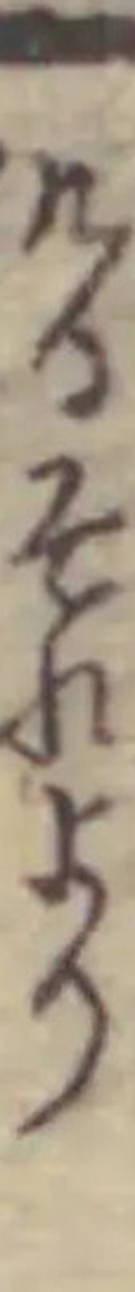けるそれより
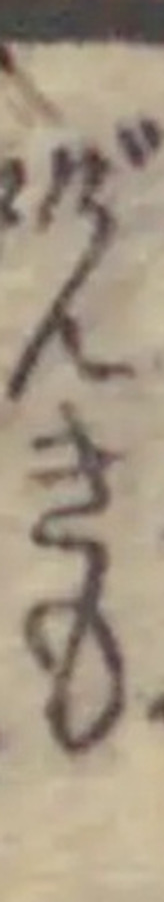げんきも
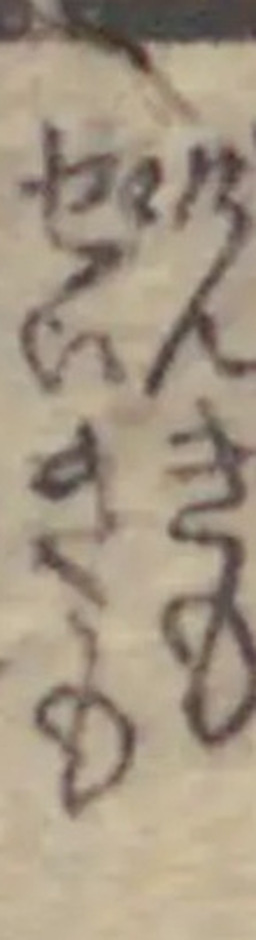せいきも
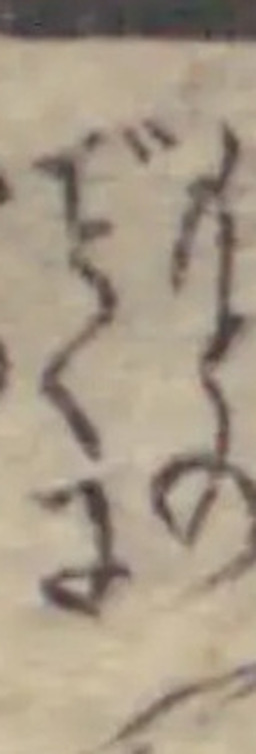ごとくに
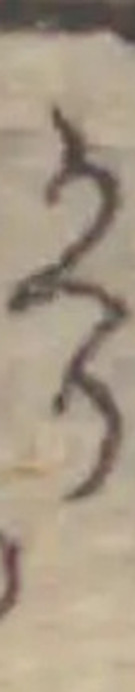かへり
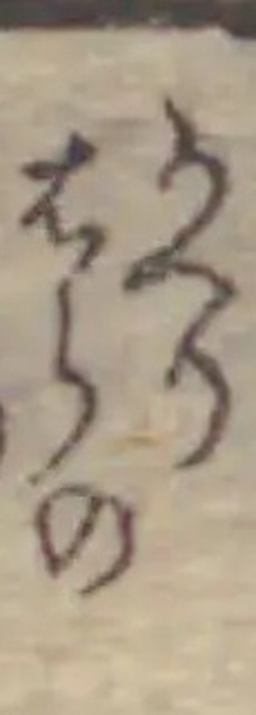はらの
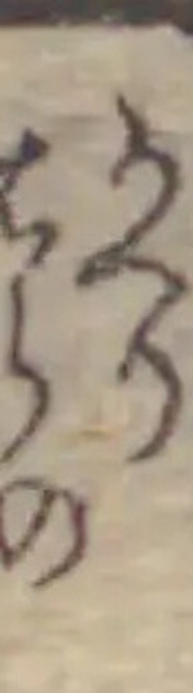はらの
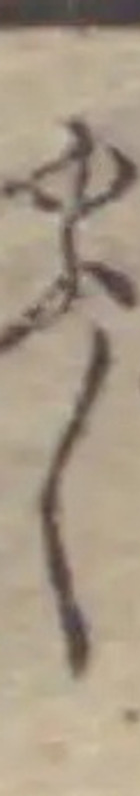やふ〳〵
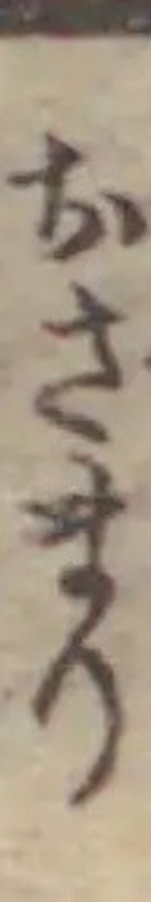おさまり
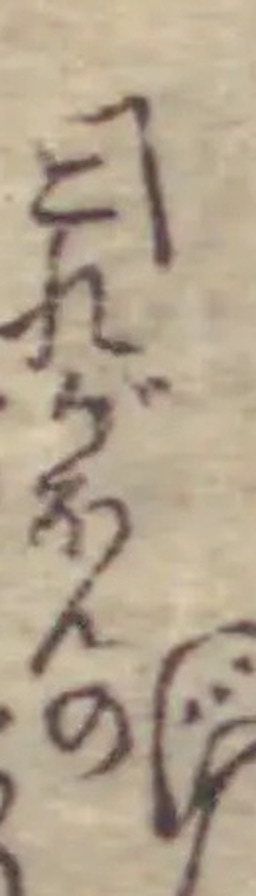〽これがほんの
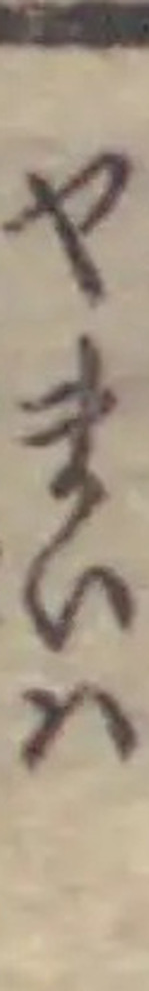やまいは
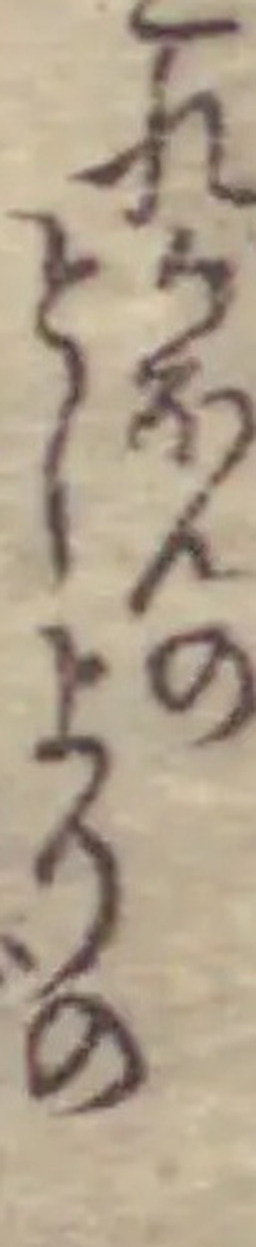としよりの
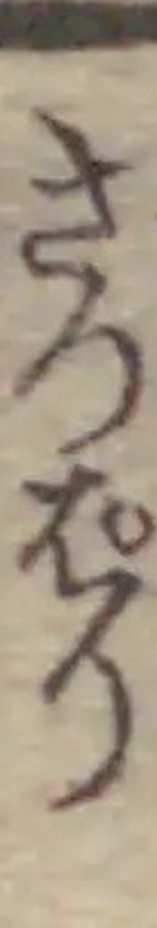きつぱり
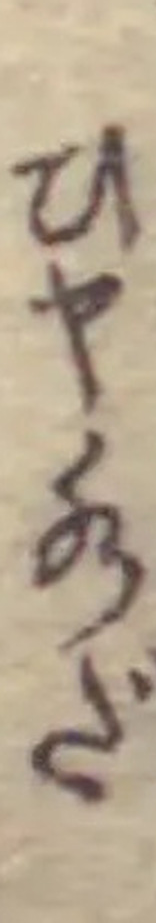ひや水だ
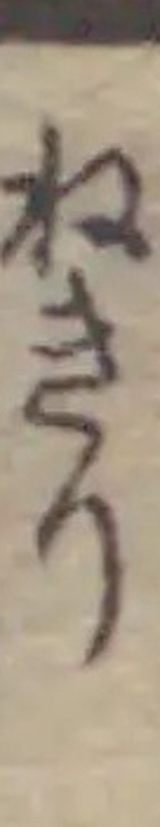ねきり
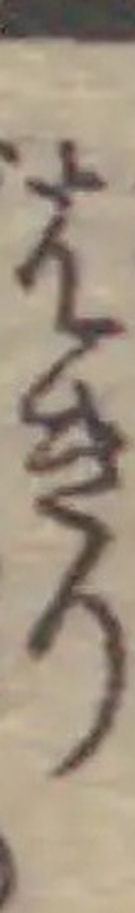はきり
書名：腹内養生主論 3巻
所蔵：国立国会図書館 National Diet Library, JAPAN
